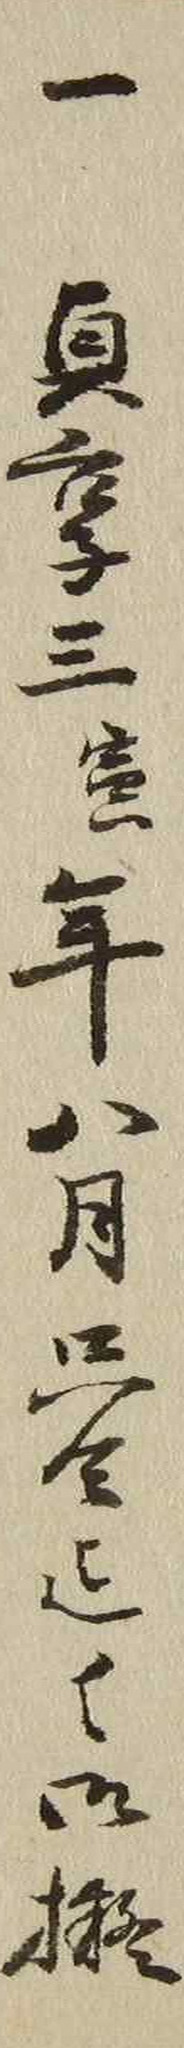一貞享三寅年八月只今迄之御擬
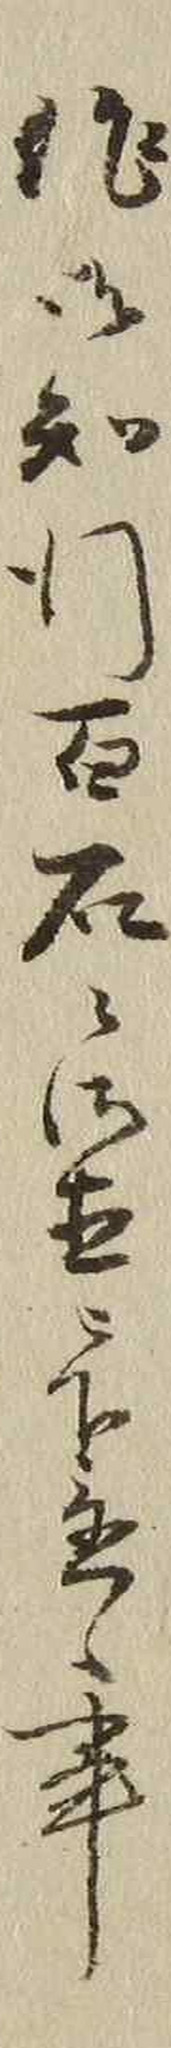作御知行百石ニ御直被下置候事
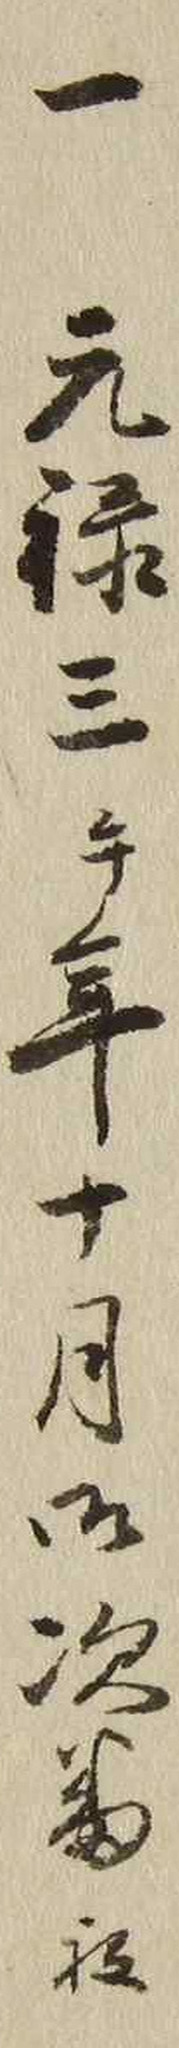一元禄三午年十月御次番被
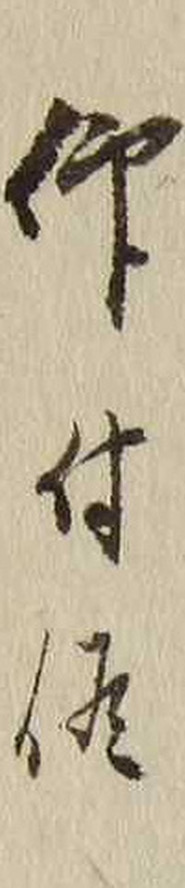仰付候
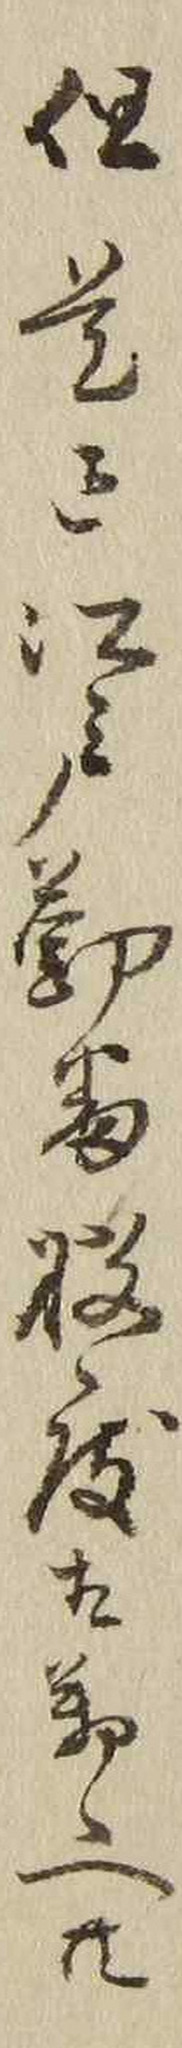但是迄江戸勤番数度相勤候へ共
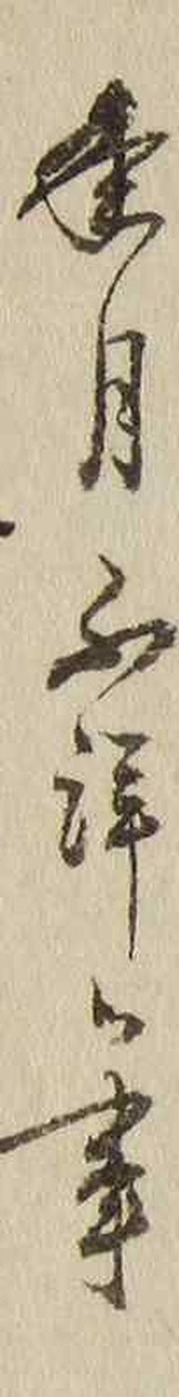年月不詳候事
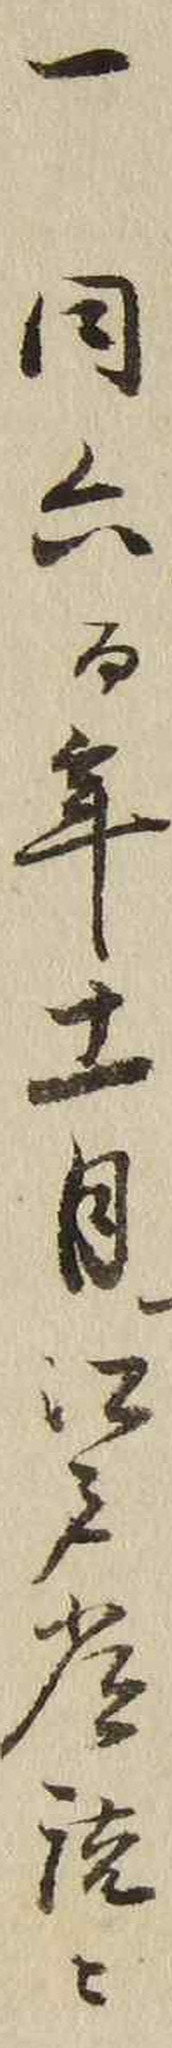一同六酉年十一月江戸常詰被
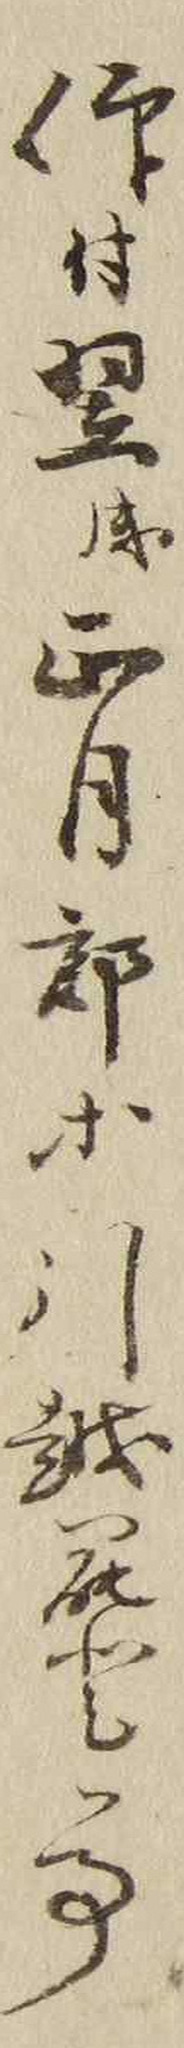仰付翌戌正月郎等引越罷登候事

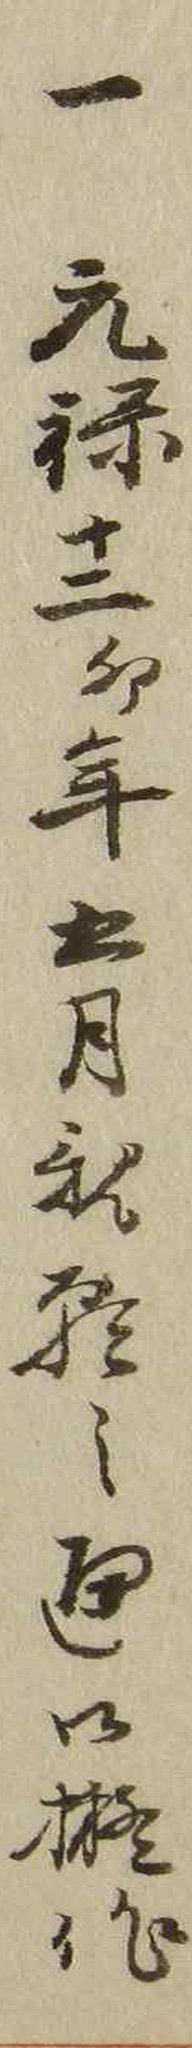一元禄十二卯年五月親願之通御擬作
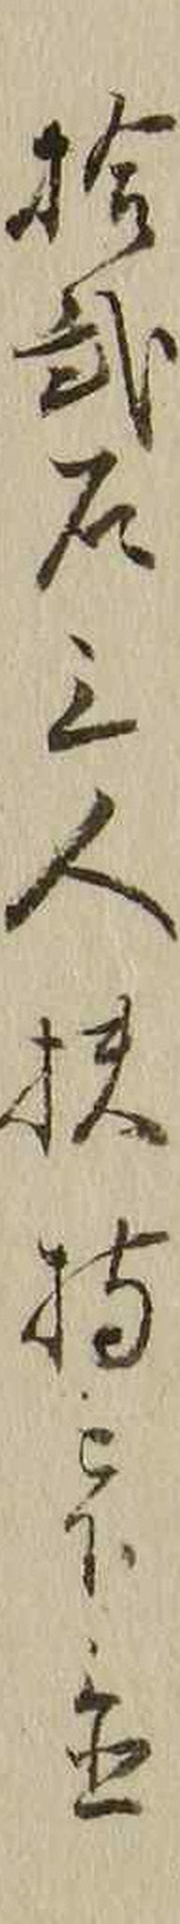拾弐石三人扶持被下置
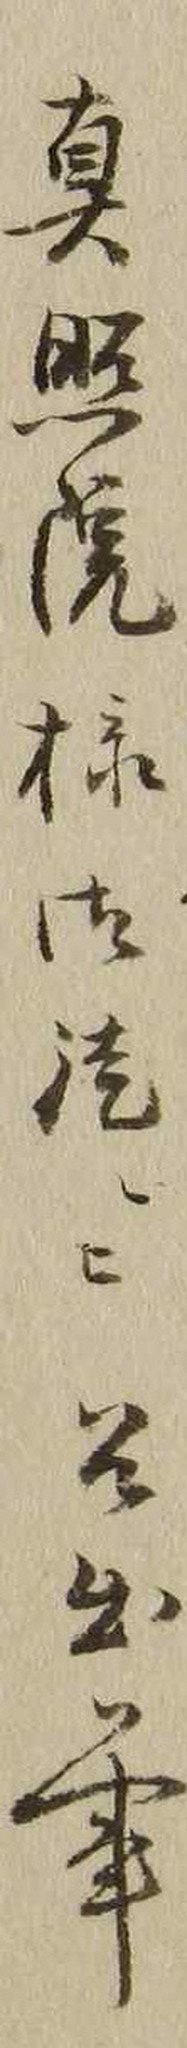真照院様御徒へ被召出候事
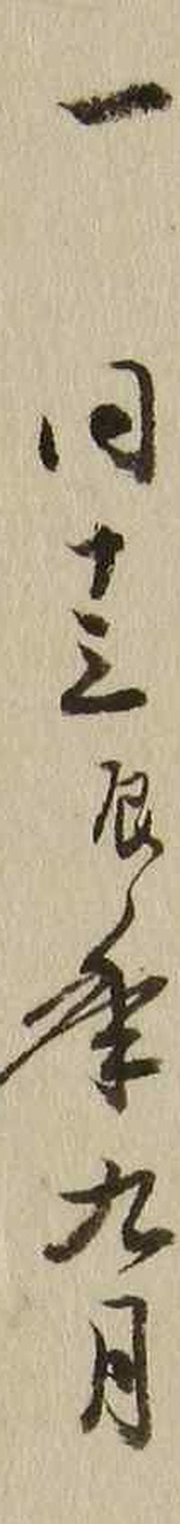一同十三辰年九月
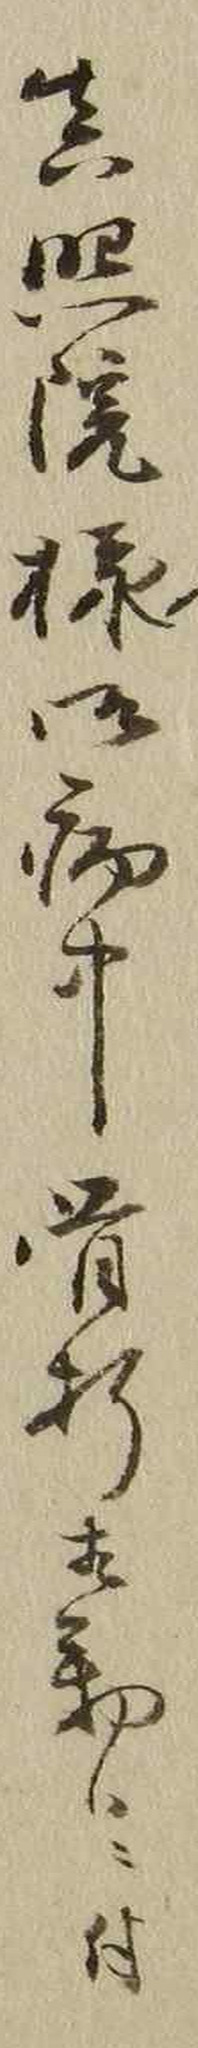真照院様御病中骨折相勤候ニ付
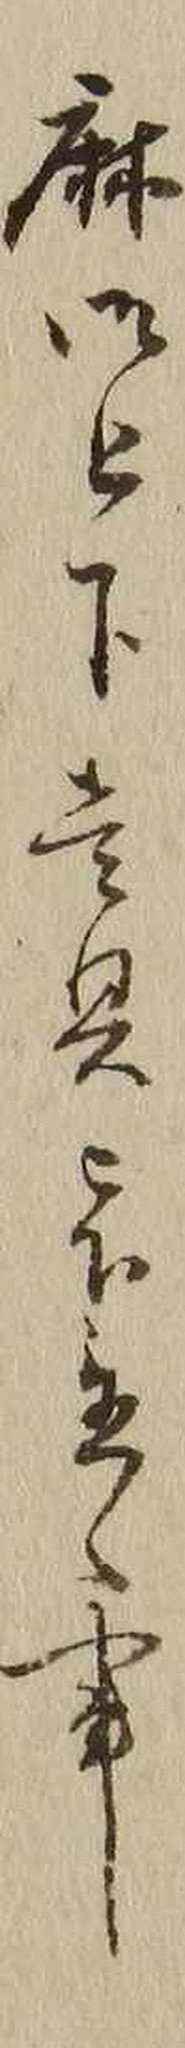麻御上下壱具被下置候事
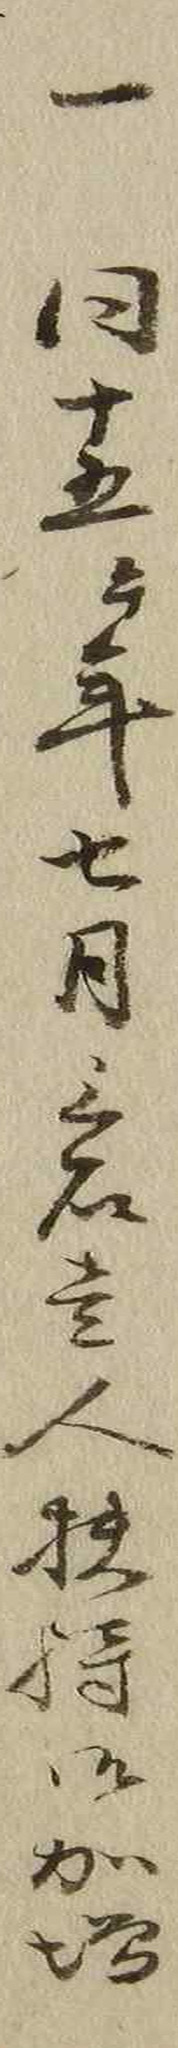一同十五午年七月三石壱人扶持御加増
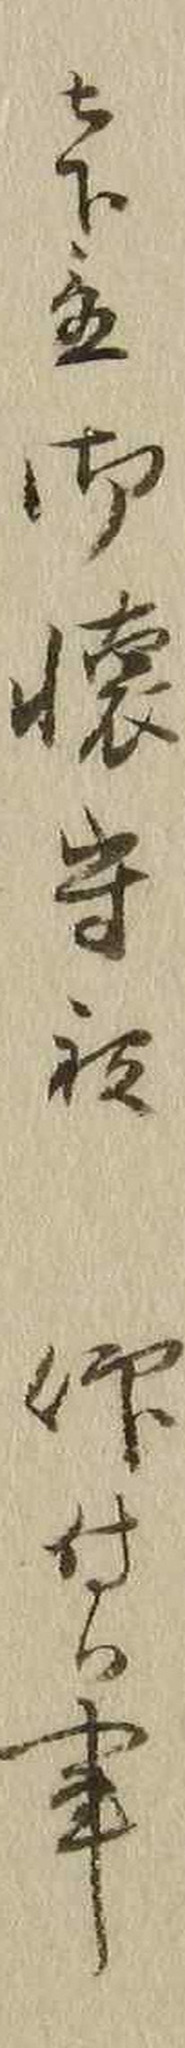被下置御懐守被仰付候事
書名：諸士系譜　巻之225　ま之部6
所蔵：会津若松市立会津図書館
